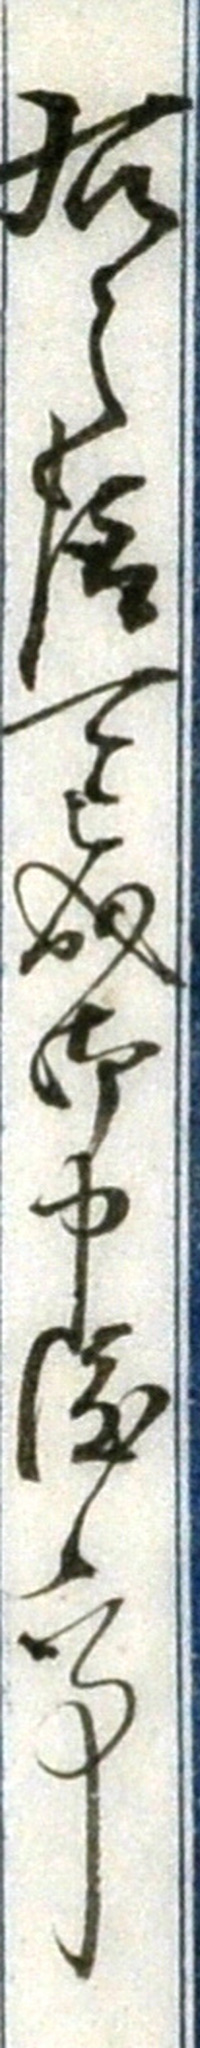右之趣可被成御申渡候事
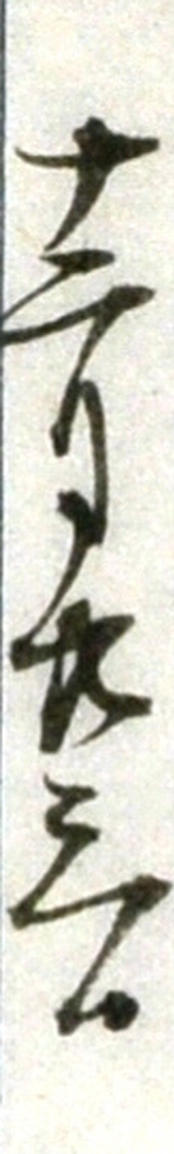十二月廿三日
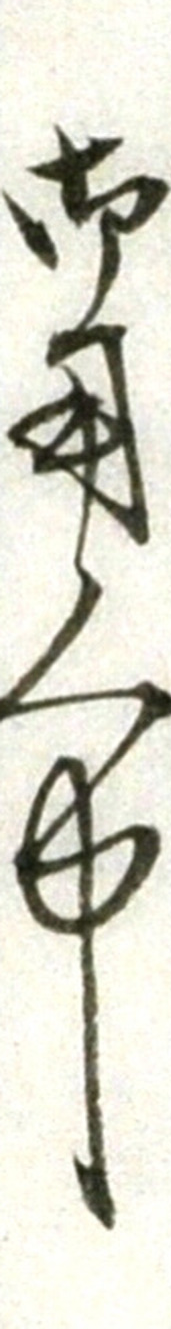御用人中
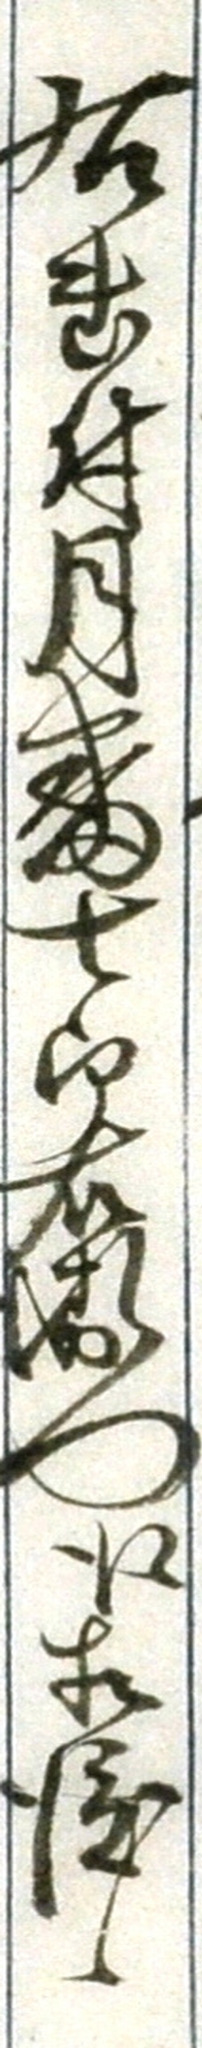右書付月番七郎右衛門江相渡候
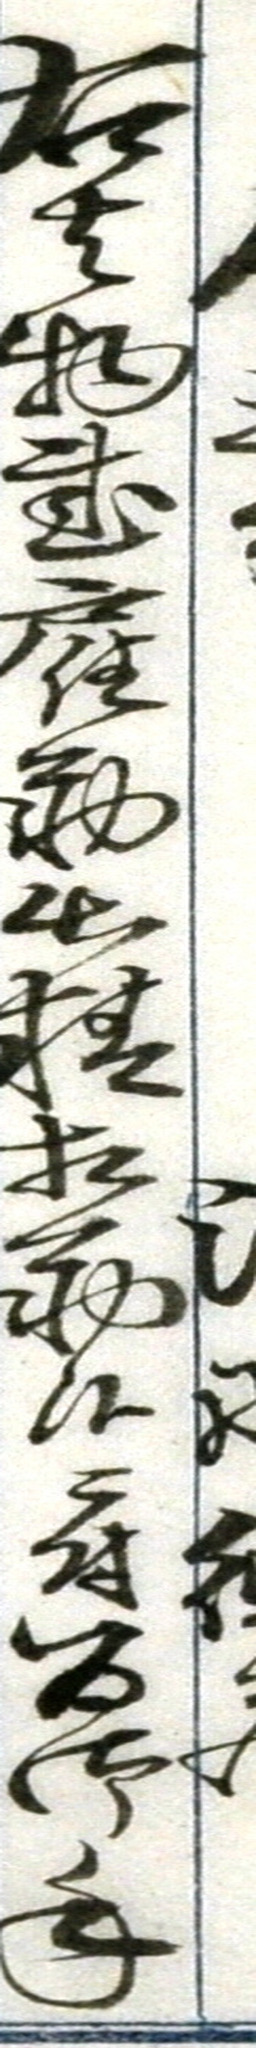右者物置雇勤出精相勤候ニ付為御手
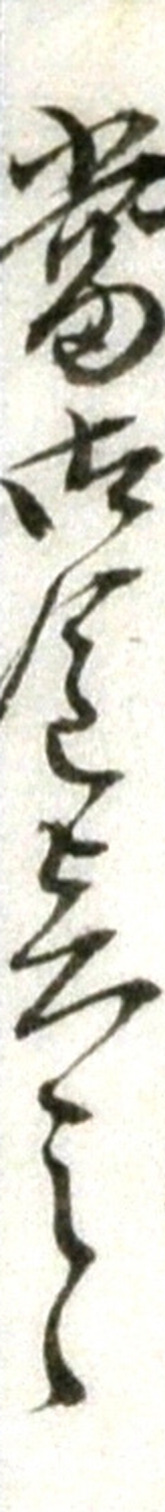当御金被下之候
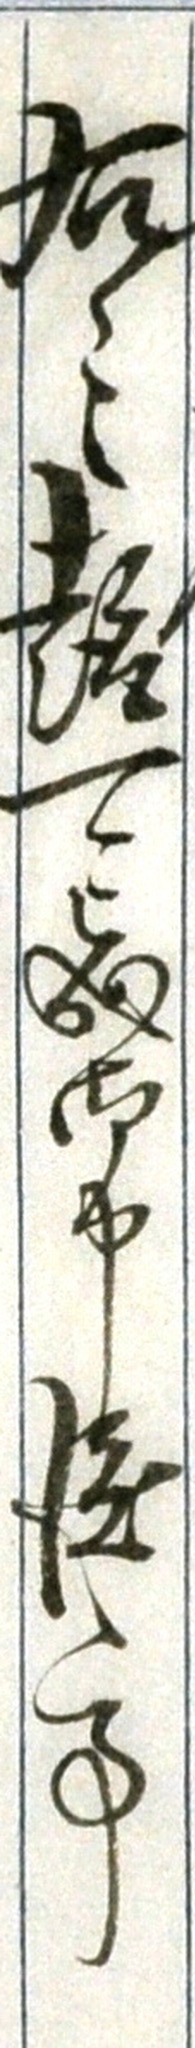右之趣可被成御申渡候事
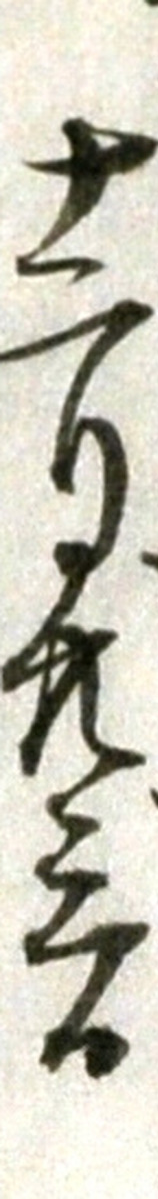十二月廿三日
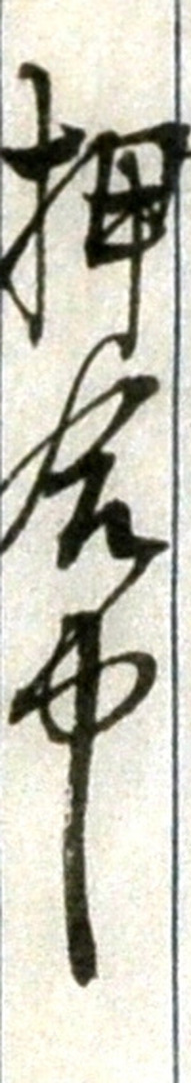押合中
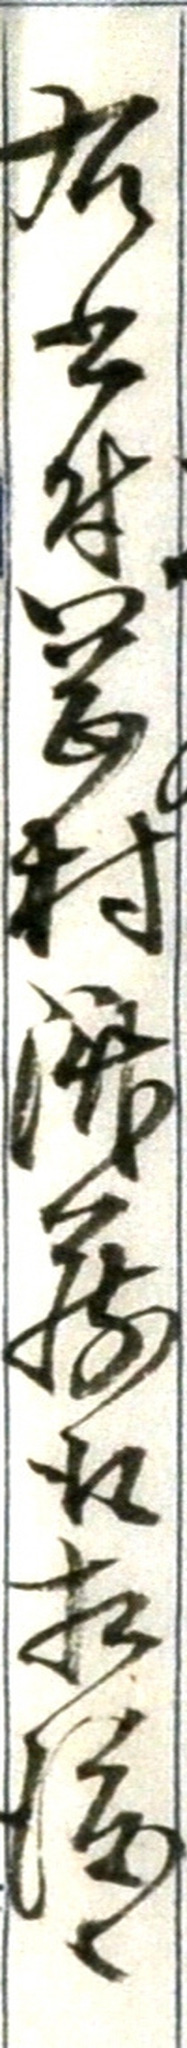右書付岡村済藏江相渡候

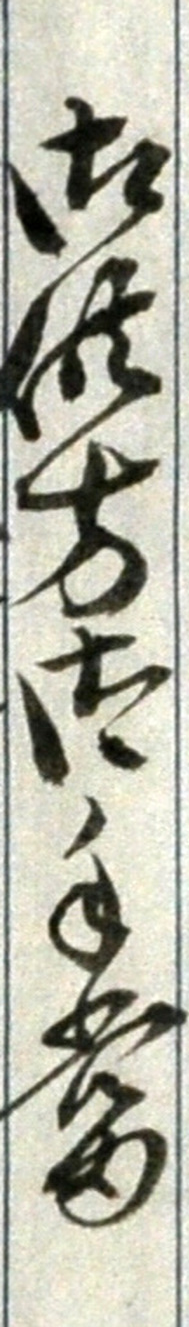御供方御手當
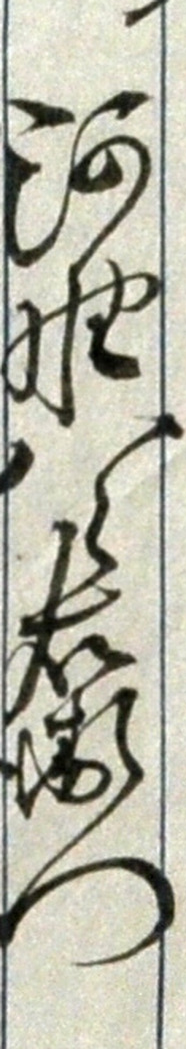河野八郎右衛門
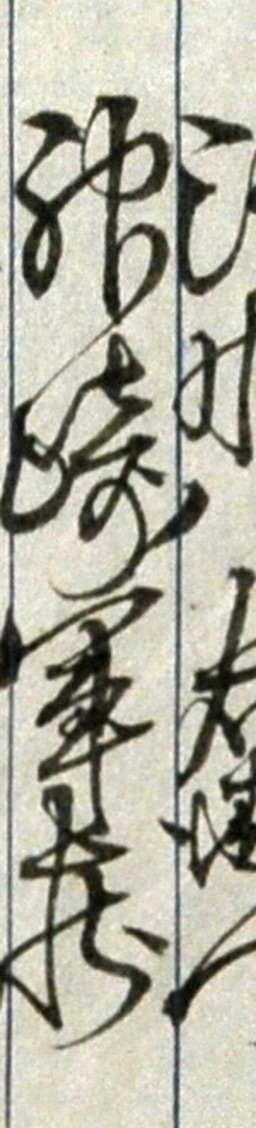神崎軍藏
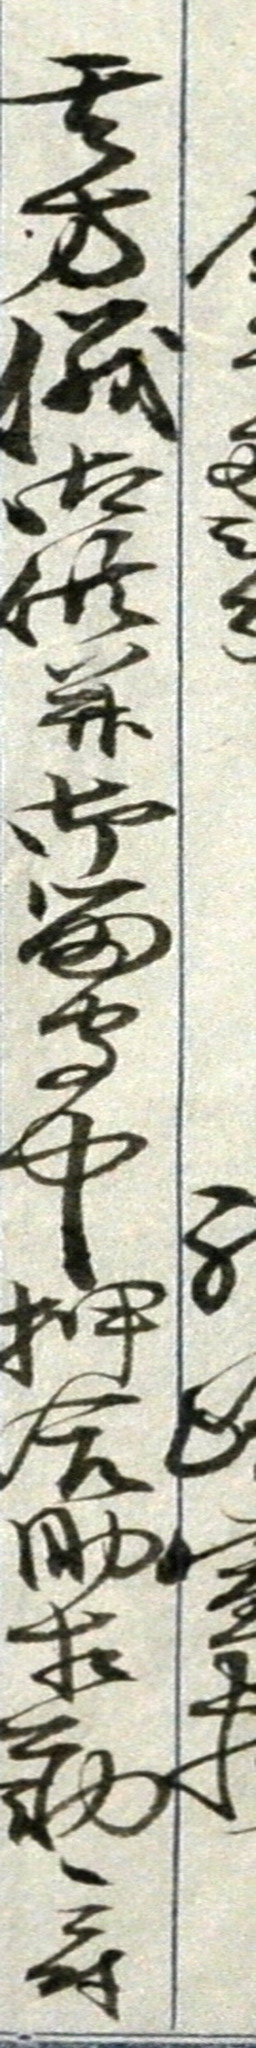其方儀御供幷御留守中押合助相勤候ニ付
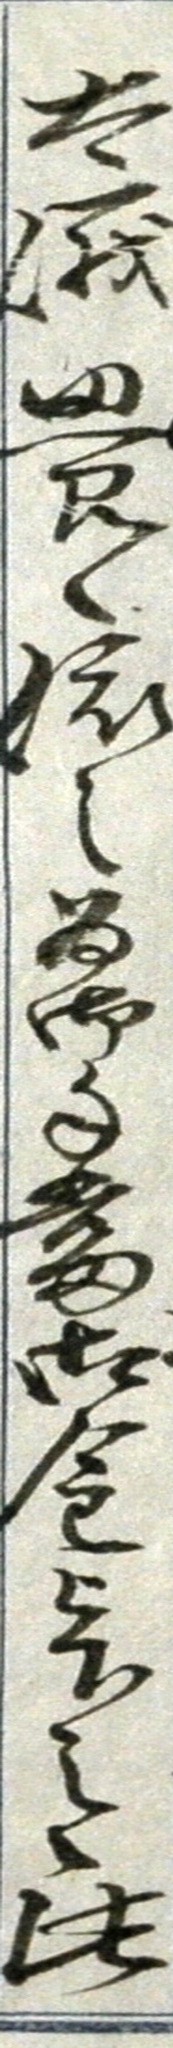太儀思召候依之為御手當御金被下之候此
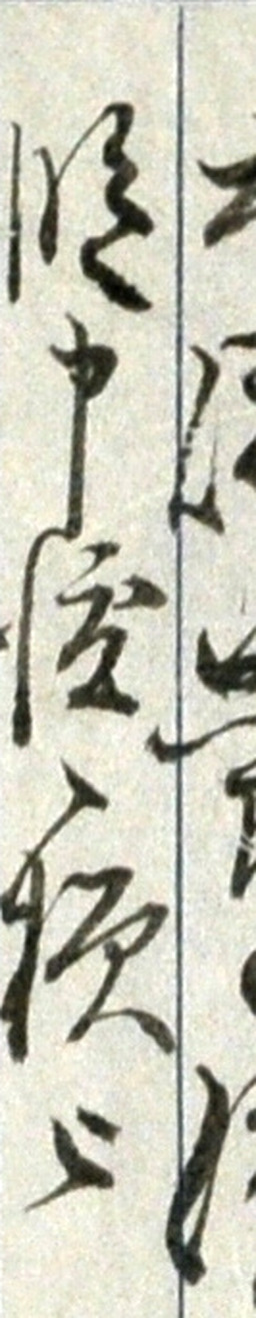段申渡候様被
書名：上方ヨリ御帰府之後江戸勤并江戸在番中之者江被下・控
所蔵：伊那市立高遠町図書館・合同会社AMANE
